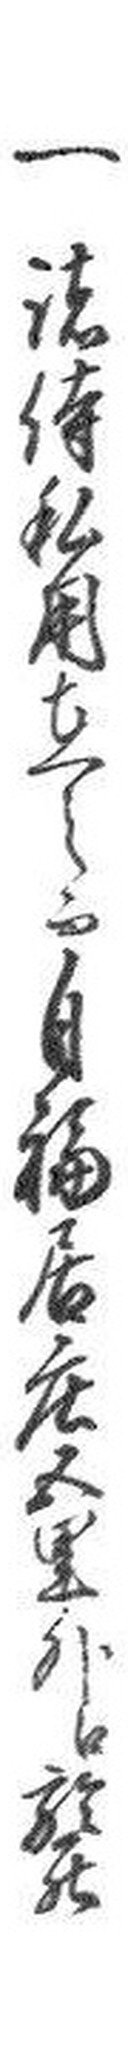一諸侍私用在之候而自福居庄五里外江於罷
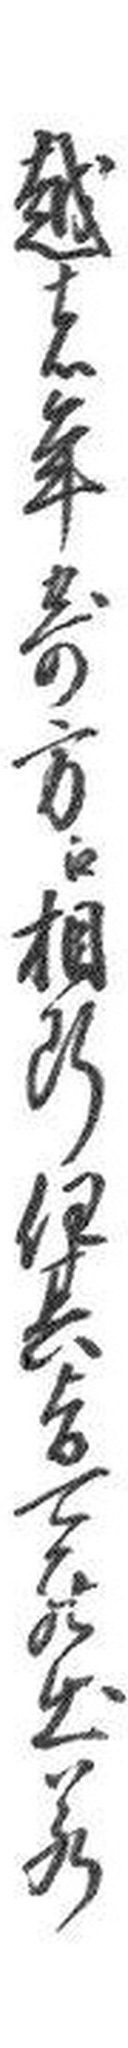越者年寄方江相断任其旨可罷出若
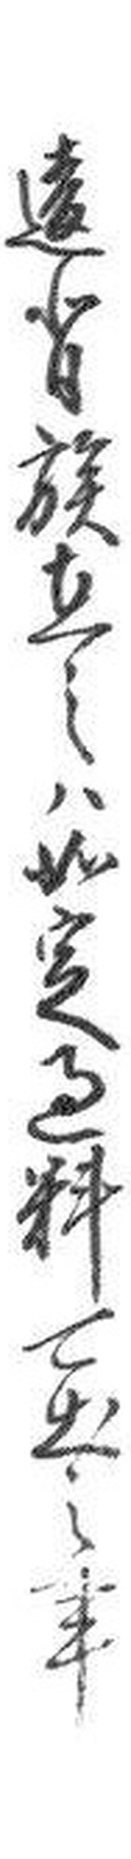違背族在之ハ如定過料可出之事
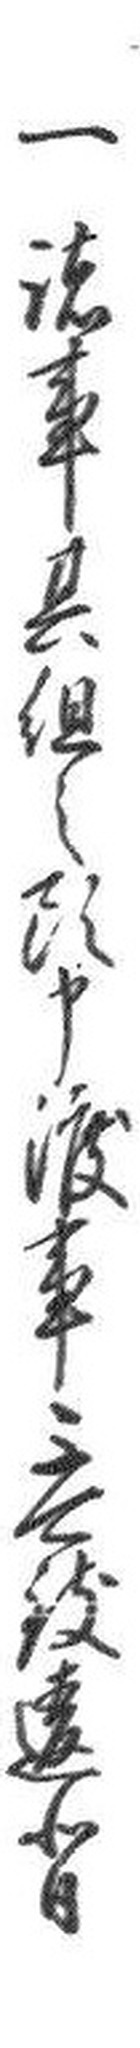一諸事其組之頭申渡事不可致違背
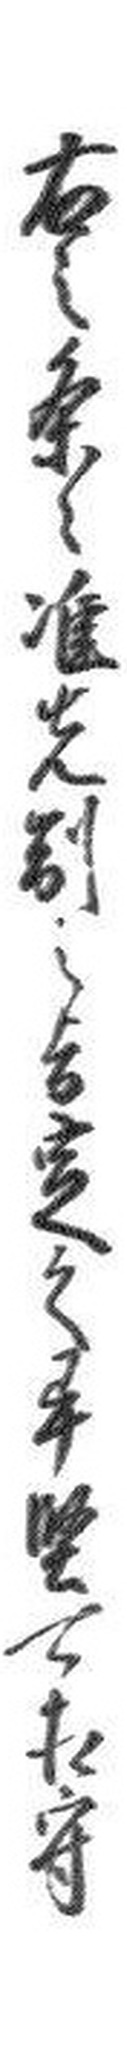右之条々准先制之旨定之畢可相守
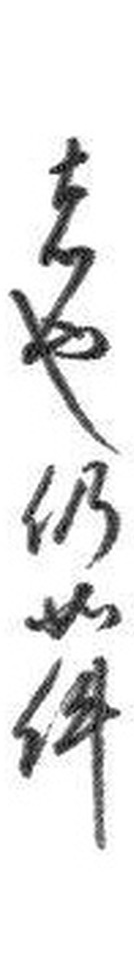者也仍如件
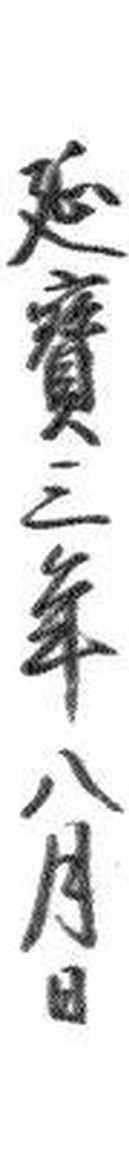延宝三年八月日
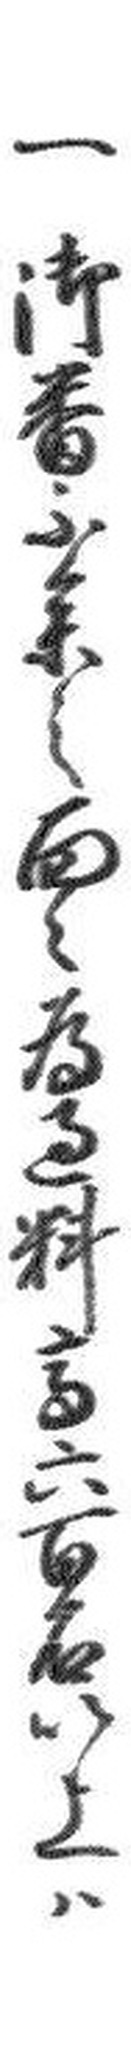一御番不参之面々為過料高六百石以上ハ
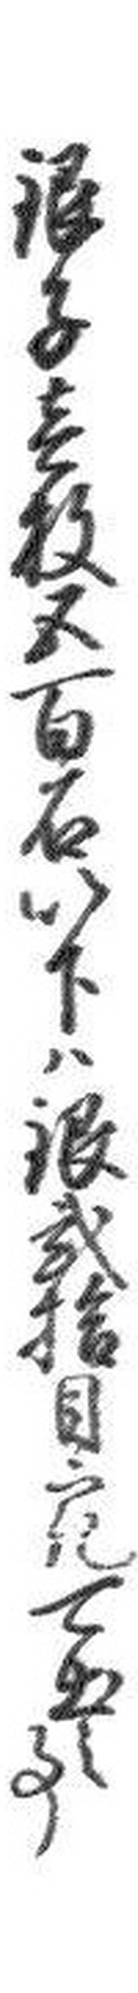銀子壱枚五百石以下ハ銀弐拾目宛可出之事
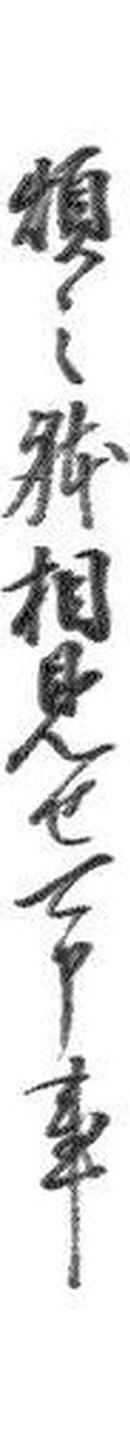煩之体相見せ可申事
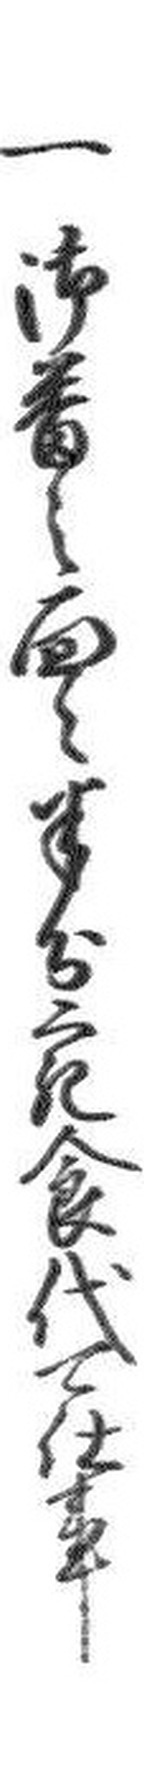一御番之面々半分宛食代可仕事

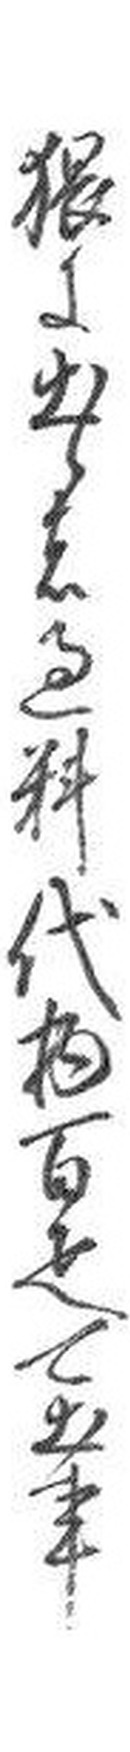猥に出候者過料代物百匹可出事
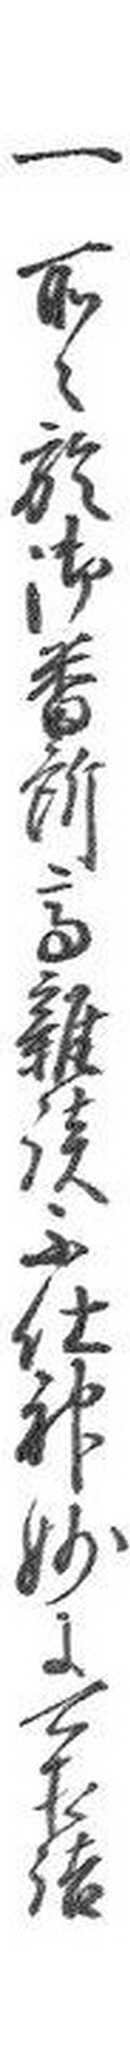一所々於御番所高雑談不仕神妙に可相詰
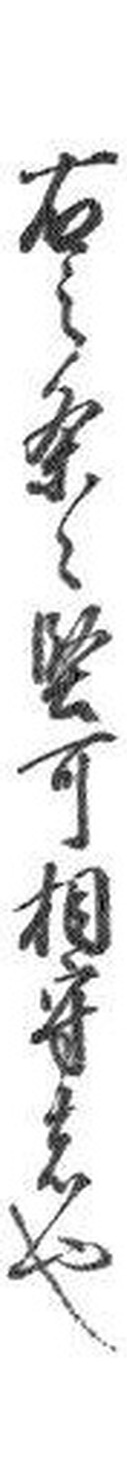右之条々堅可相守者也
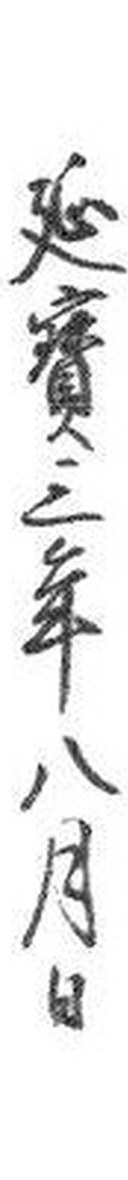延宝三年八月日
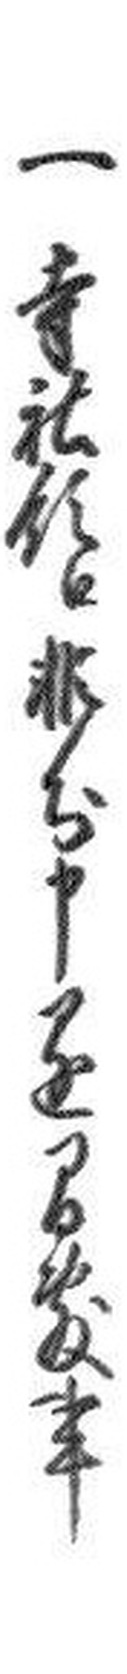一寺社領江非分申懸間敷事
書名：家譜 十一 昌親公 従延宝二年到延宝四年八月
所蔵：福井県文書館 Fukui Prefectural Archives
